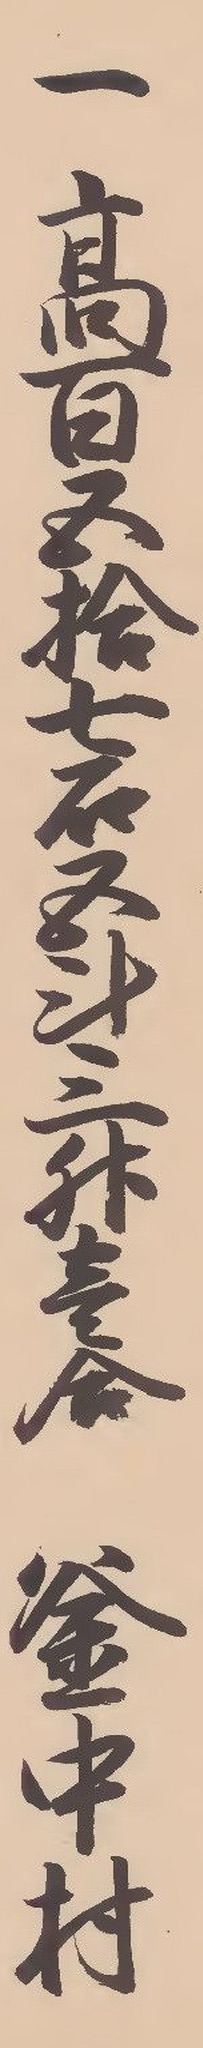一高百五拾七石五斗三升壱合釜中村
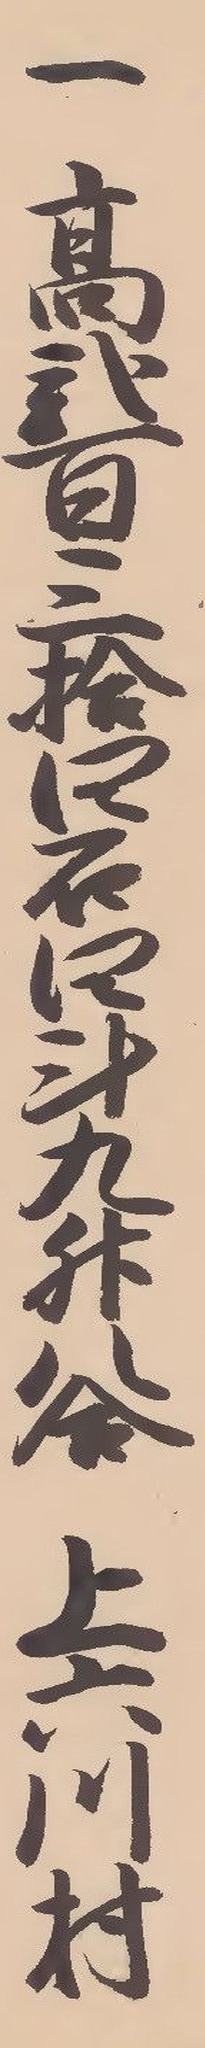一高弐百三拾四石四斗九升八合上六川村
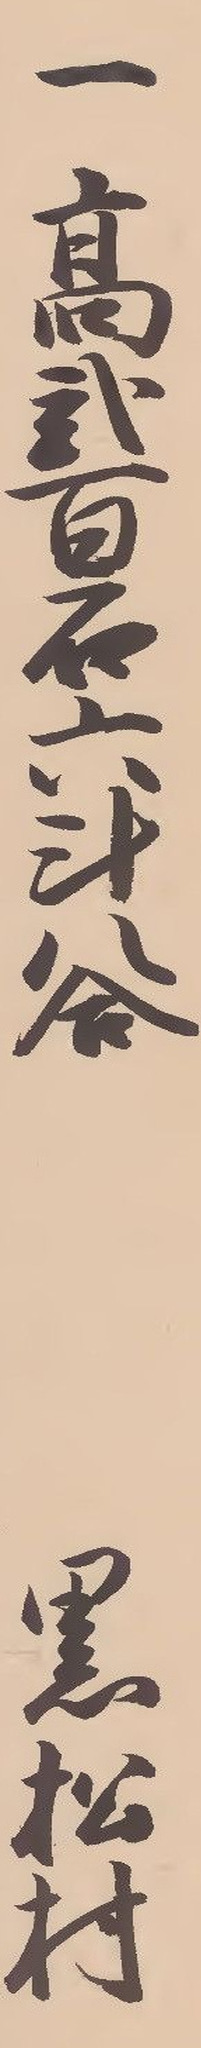一高弐百石六斗八合黒松村
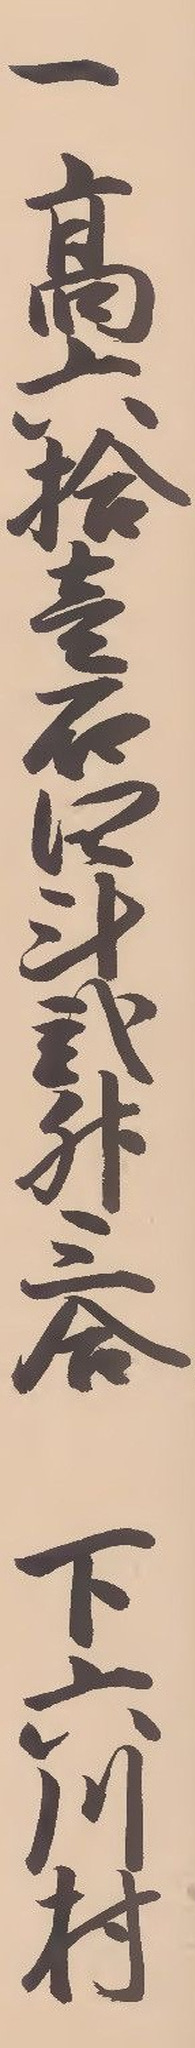一高六拾壱石四斗弐升三合下六川村
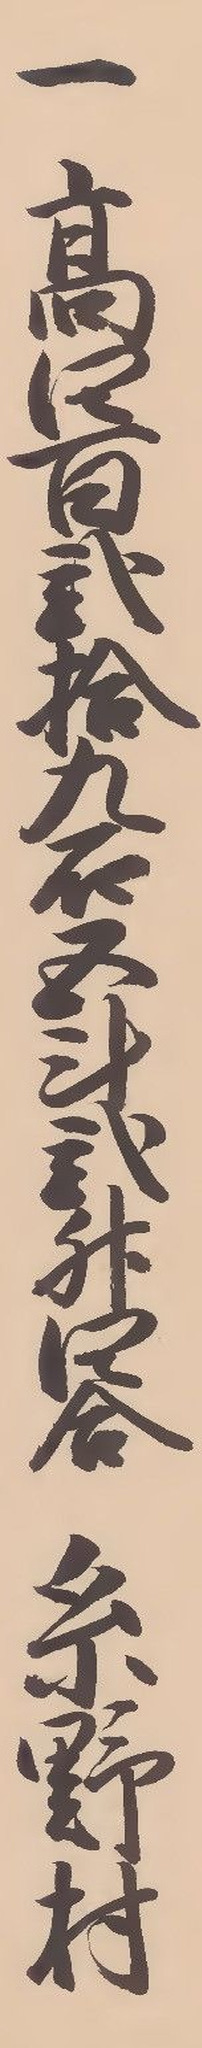一高四百弐拾九石五斗弐升四合糸野村
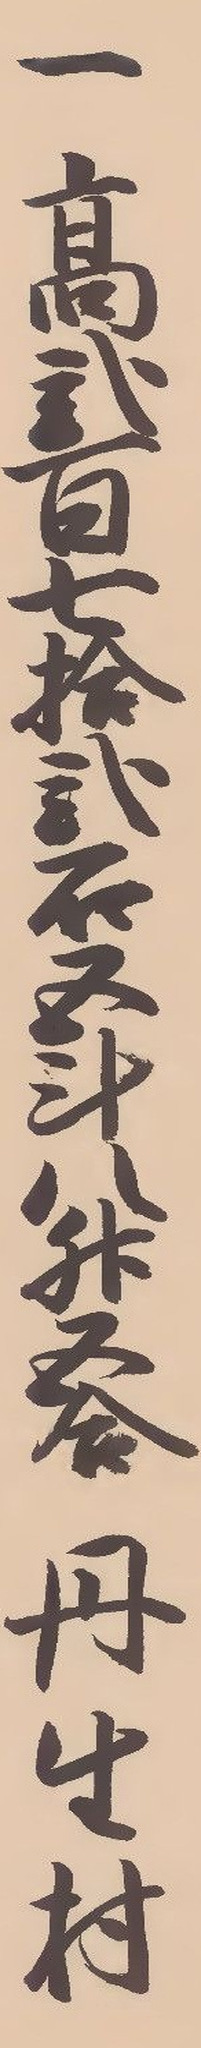一高弐百七拾弐石五斗八升五合丹生村

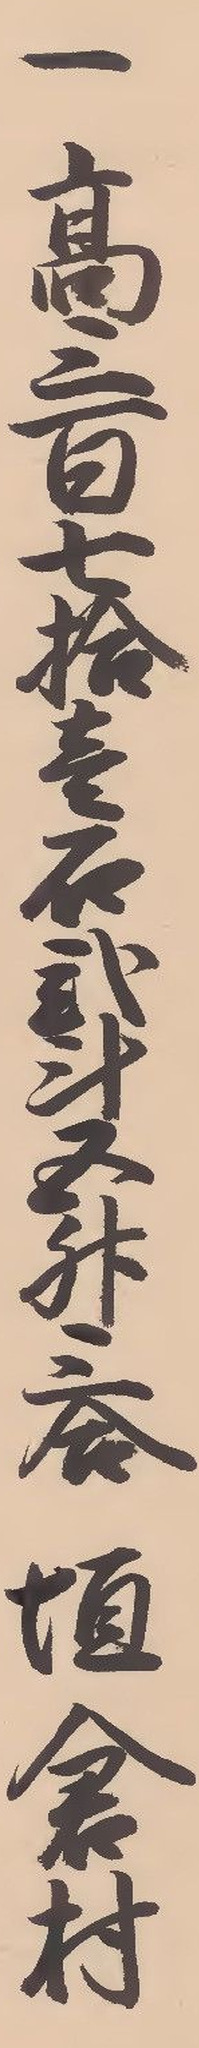一高三百七拾壱石弐斗五升三合垣倉村
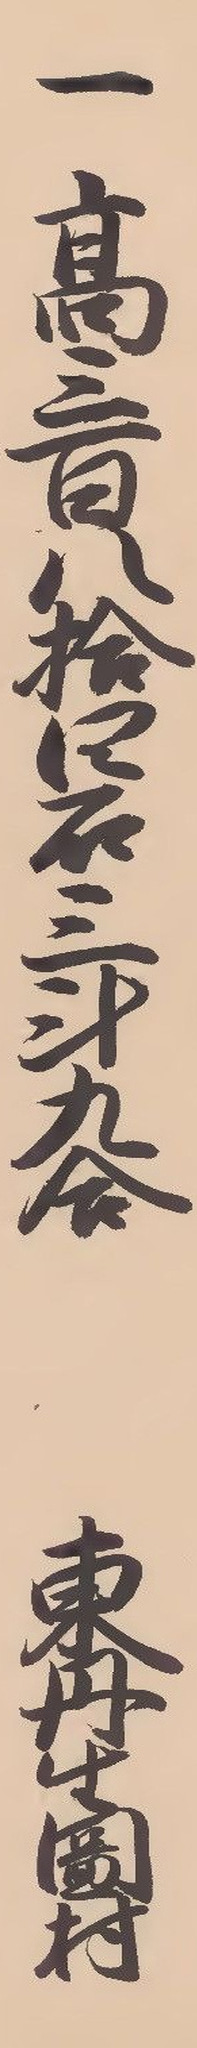一高三百八拾四石三斗九合東丹生図村
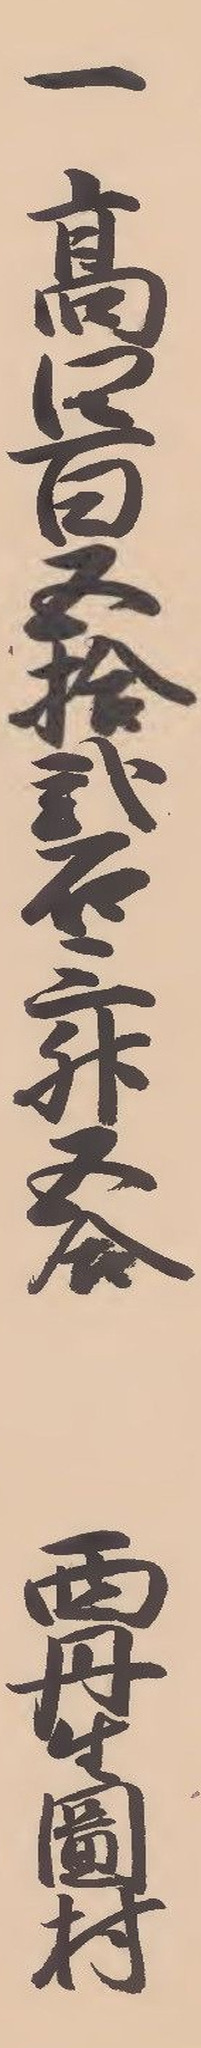一高四百五拾弐石三升五合西丹生図村
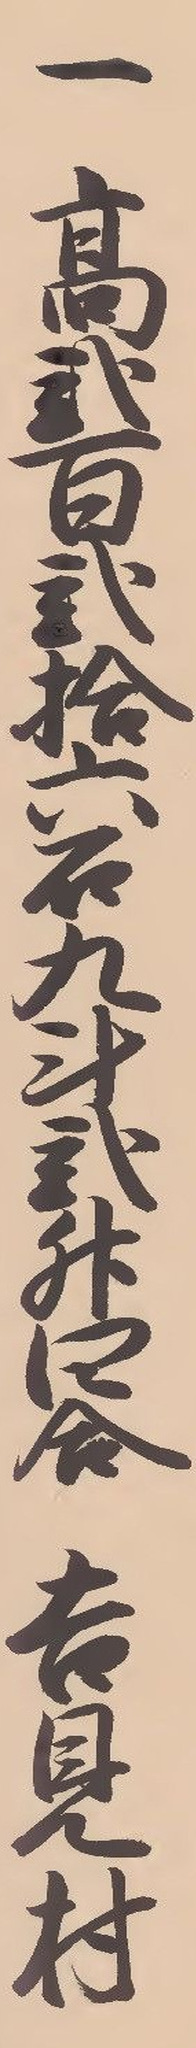一高弐百弐拾六石九斗弐升四合吉見村
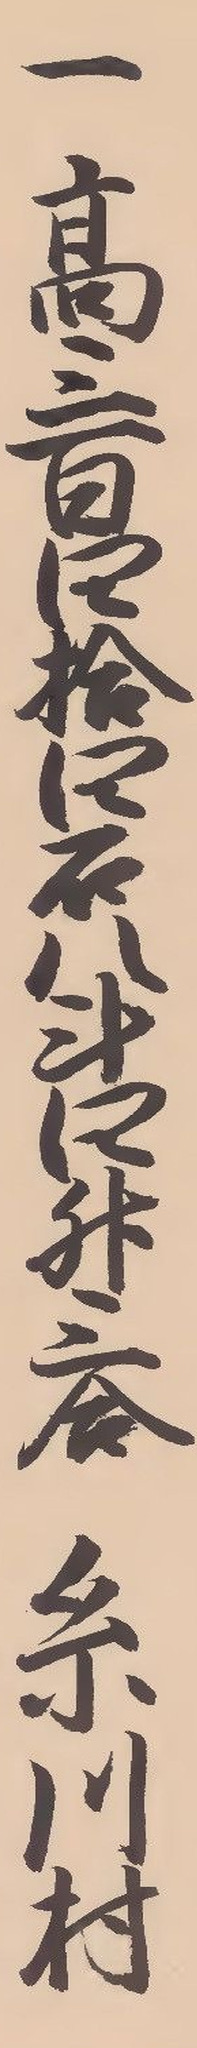一高三百四拾四石八斗四升三合糸川村
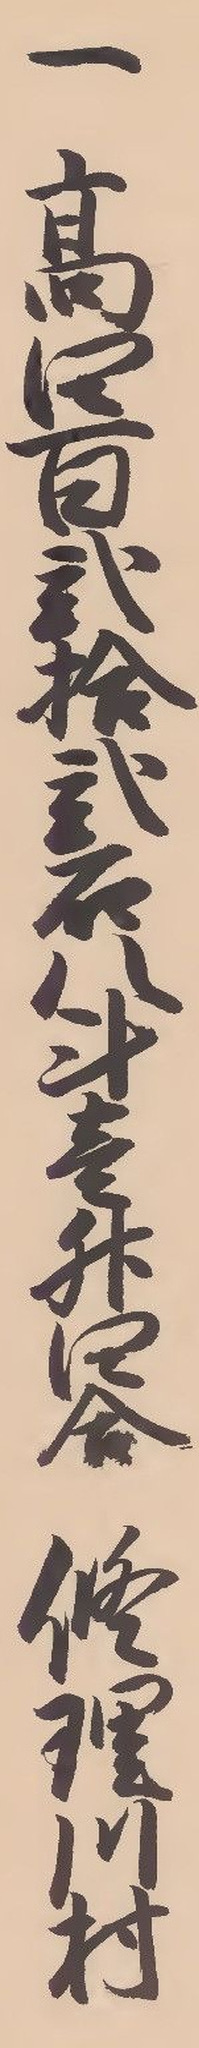一高四百弐拾弐石八斗壱升四合修理川村

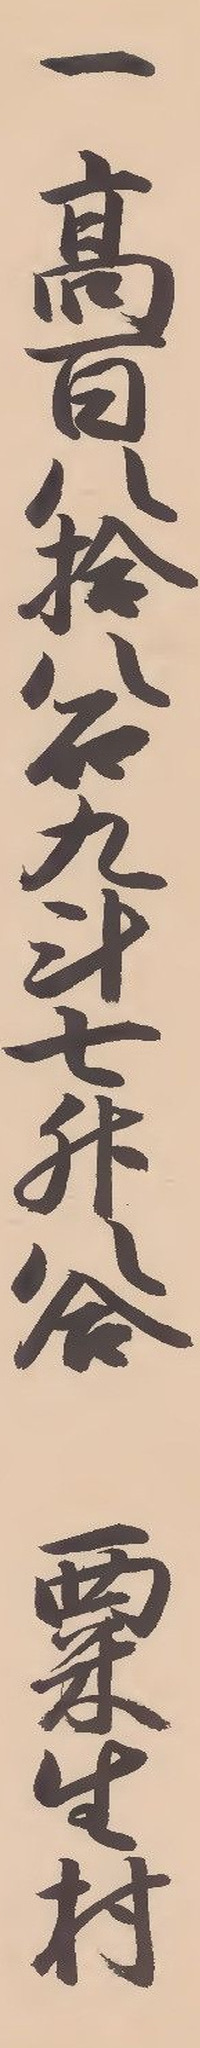一高百八拾八石九斗七升八合粟生村
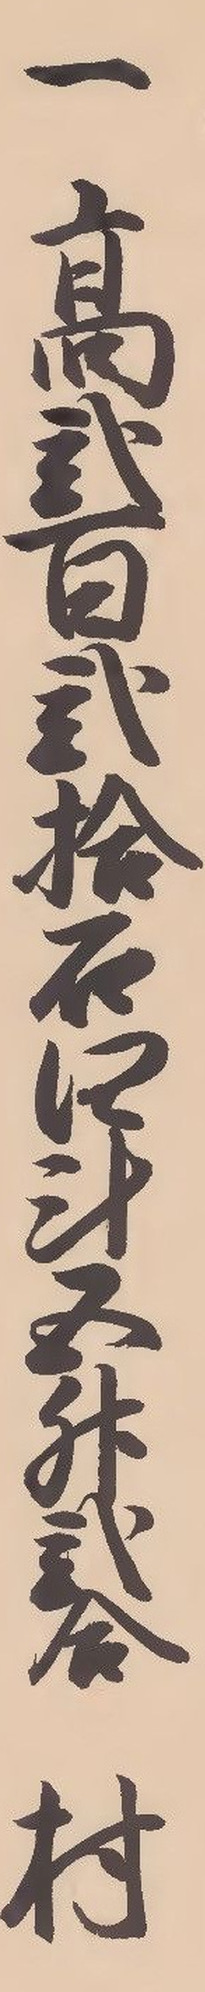一高弐百弐拾石四斗五升弐合村
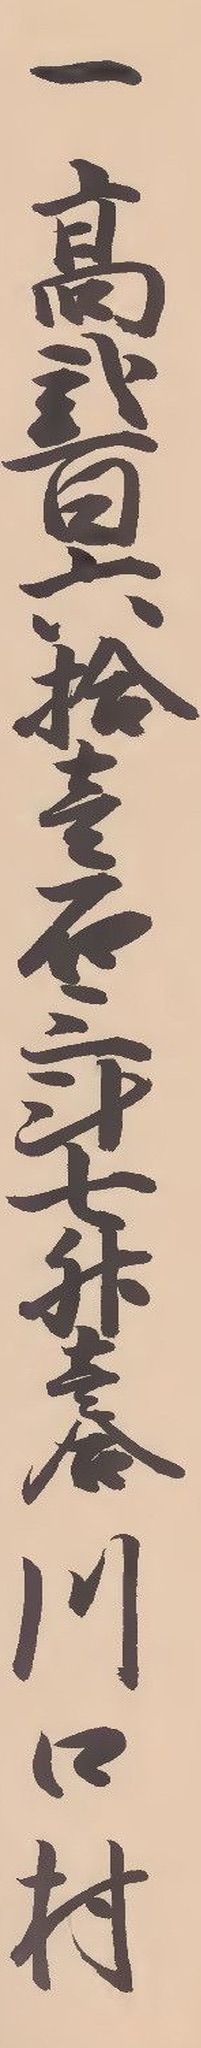一高弐百六拾壱石三斗七升壱合川口村
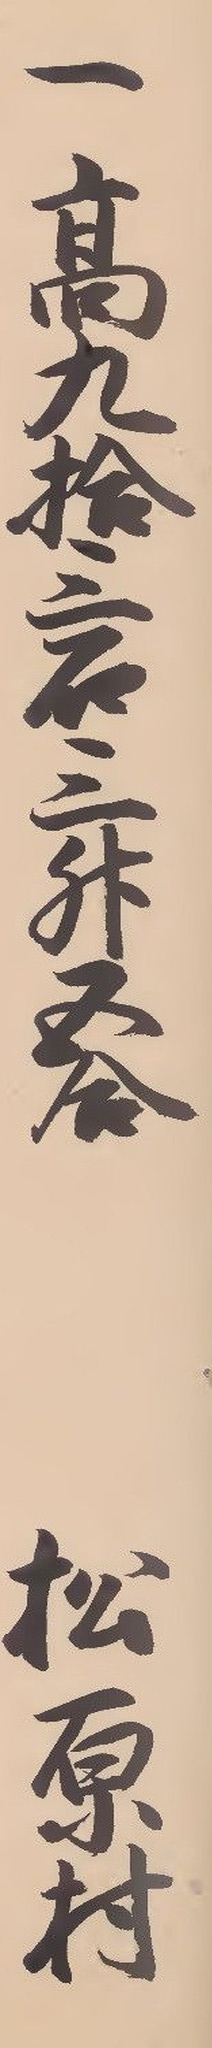一高九拾三石三升五合松原村
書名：紀伊国郷帳
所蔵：国立公文書館 National Archives of Japan
